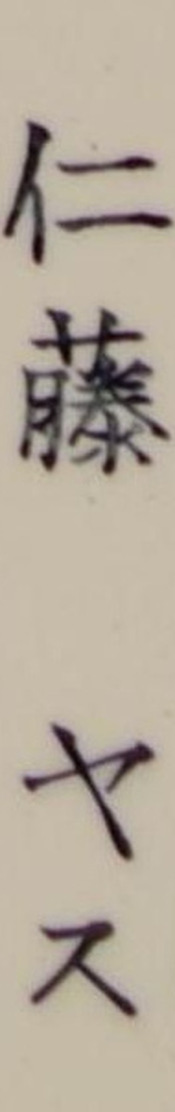仁藤ヤス
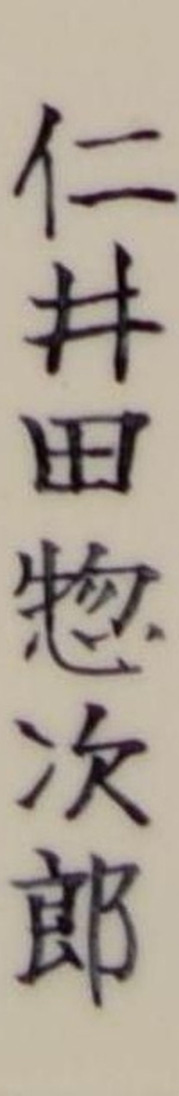仁井田惣次郎
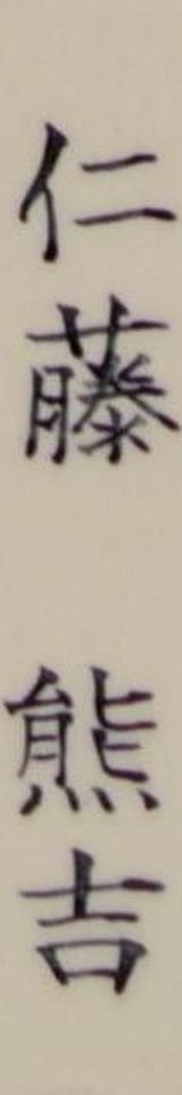仁藤熊吉
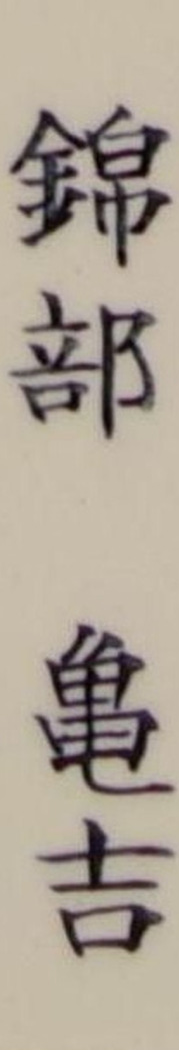錦部亀吉
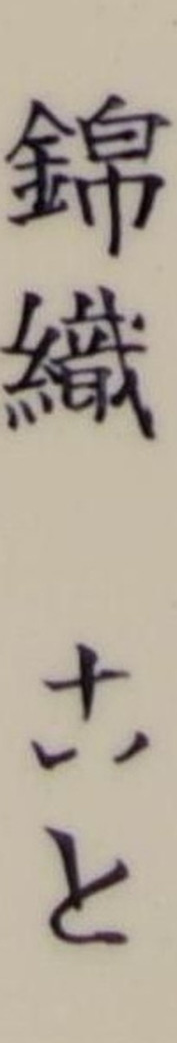錦織こと
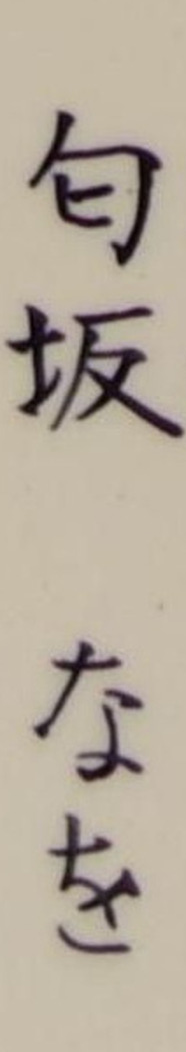匂坂なを
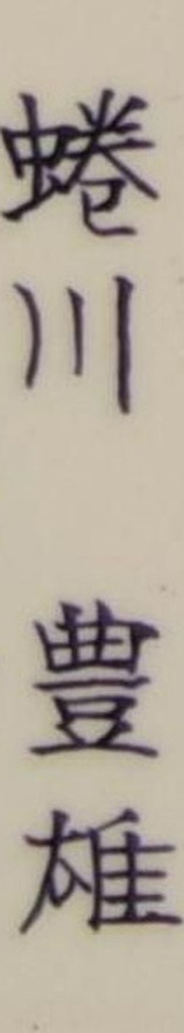蜷川豊雄
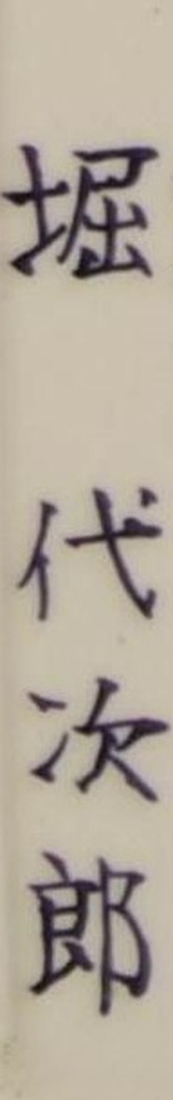堀代次郎

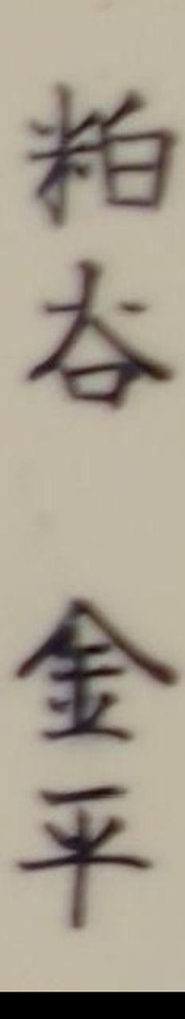粕谷金平
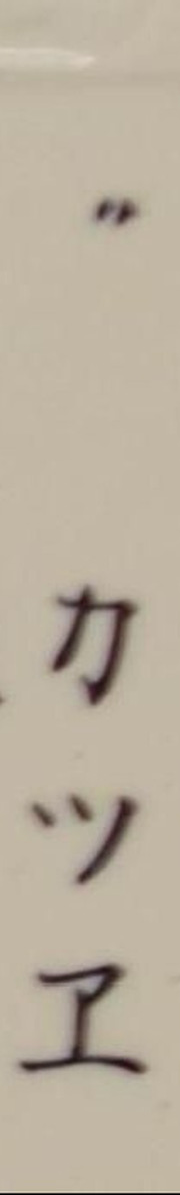カツエ
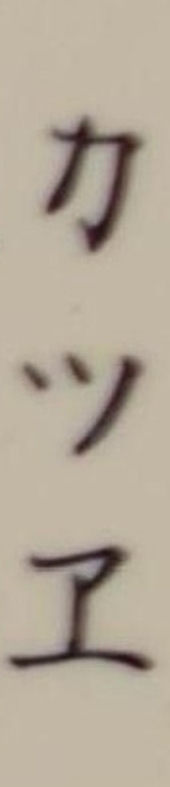カツエ
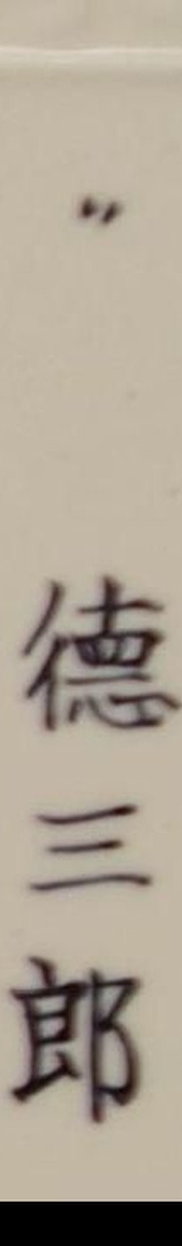徳三郎
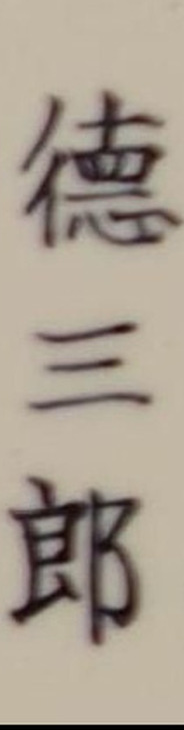徳三郎
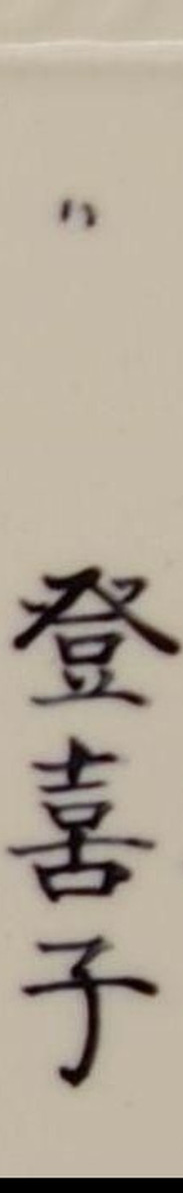登喜子
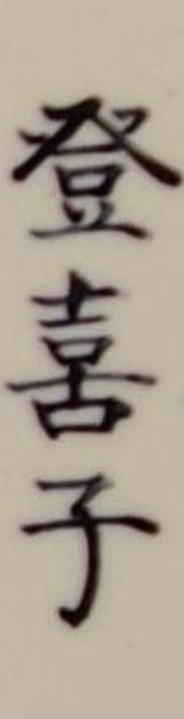登喜子
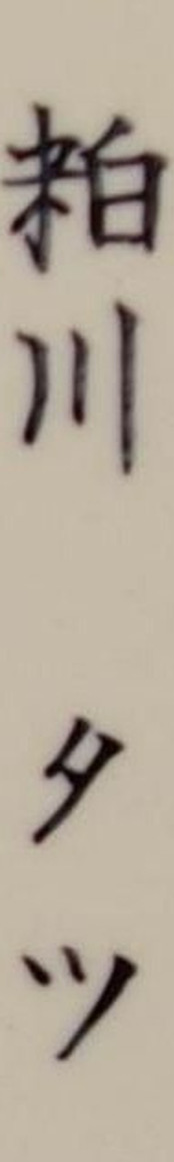粕川タツ
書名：M~S
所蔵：高野山金剛峯寺
